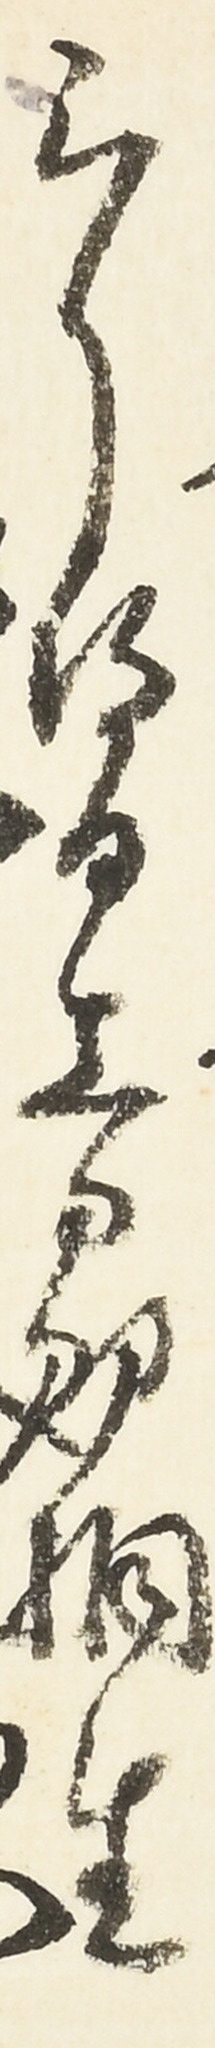三月四日上州桐生
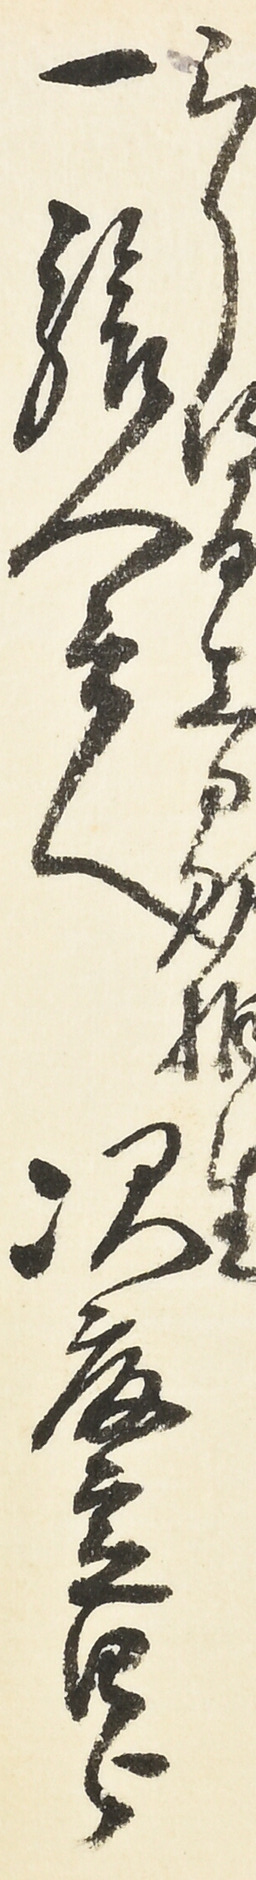一旅人壱人次藤定四郎
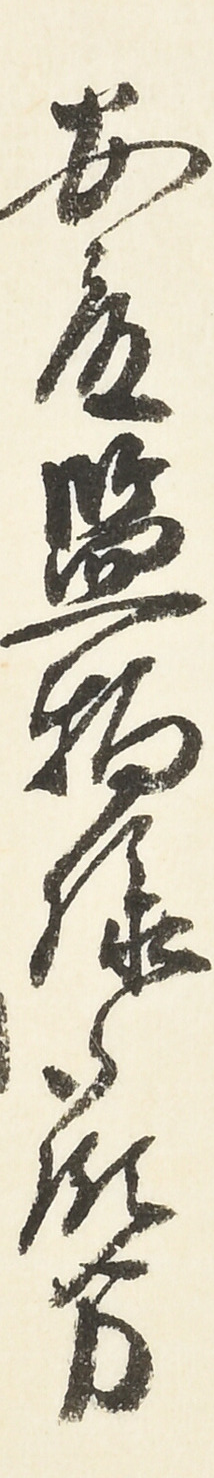安藤監物様御領分
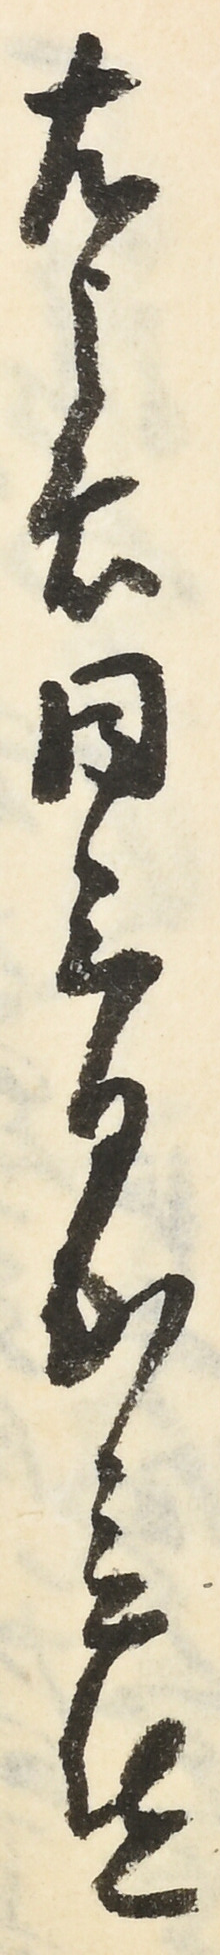右之者同三日出立仕候

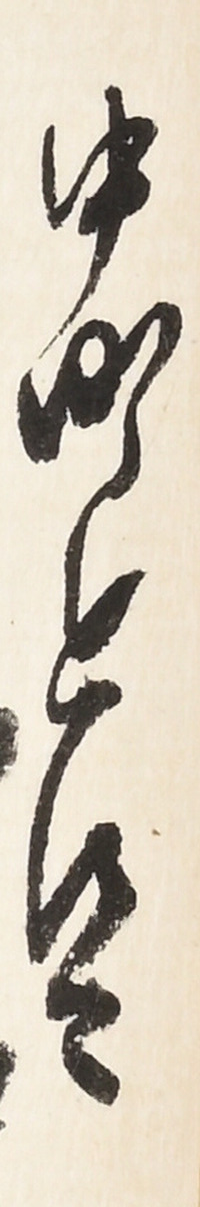中町近江や
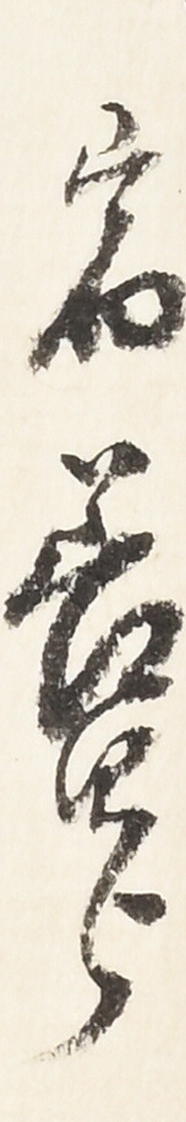宿善四郎
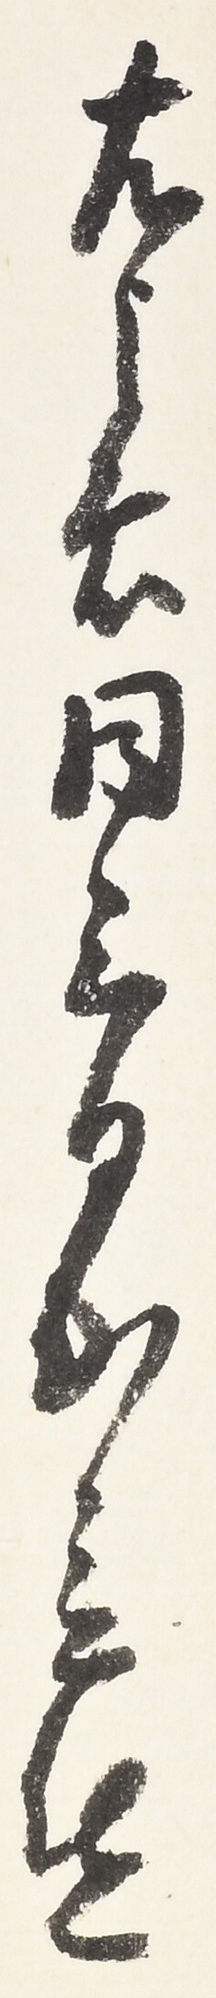右之者同三日出立仕候
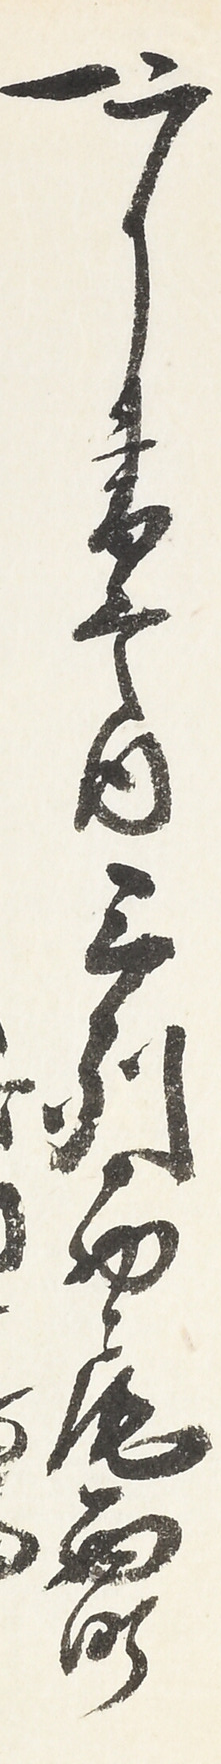二月書上之内参集西尾西町
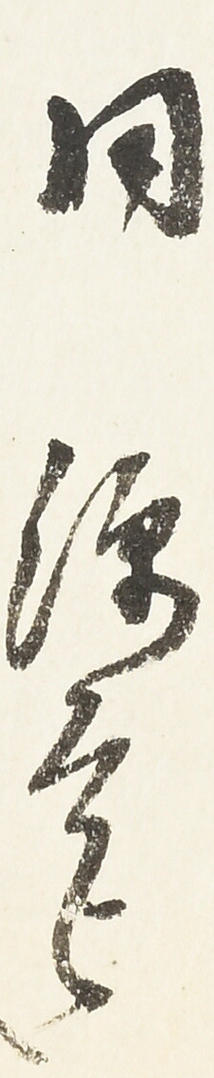同源太郎
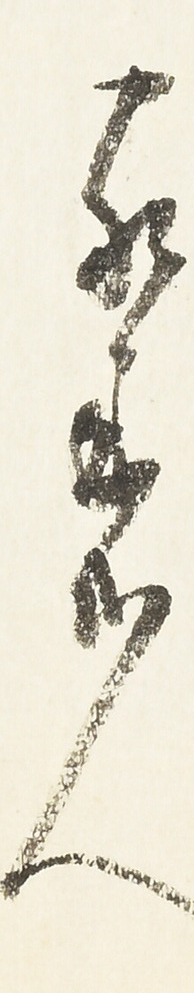家来弐人
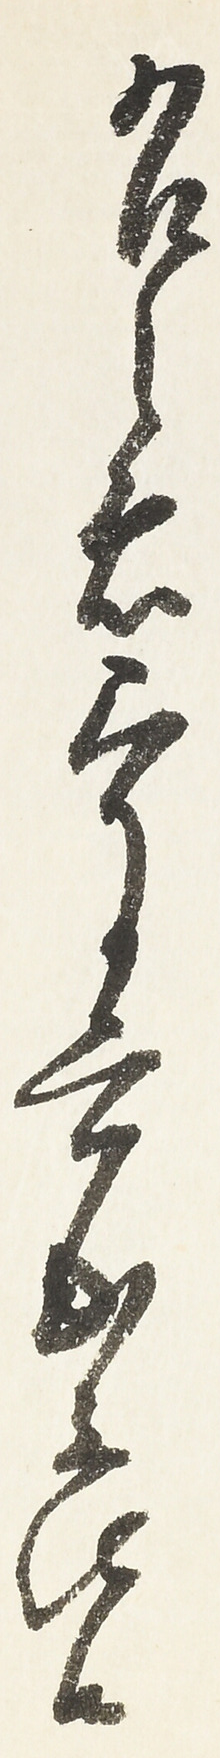右之者三月一日出立仕候
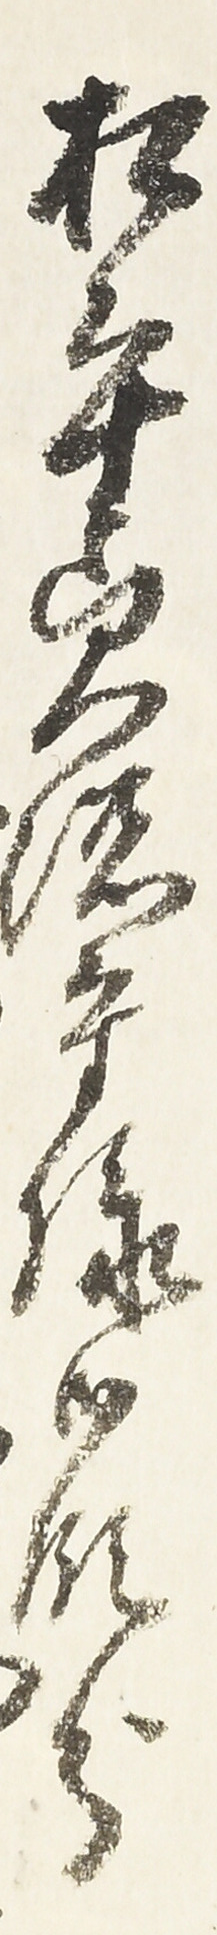松平美濃守様御領分
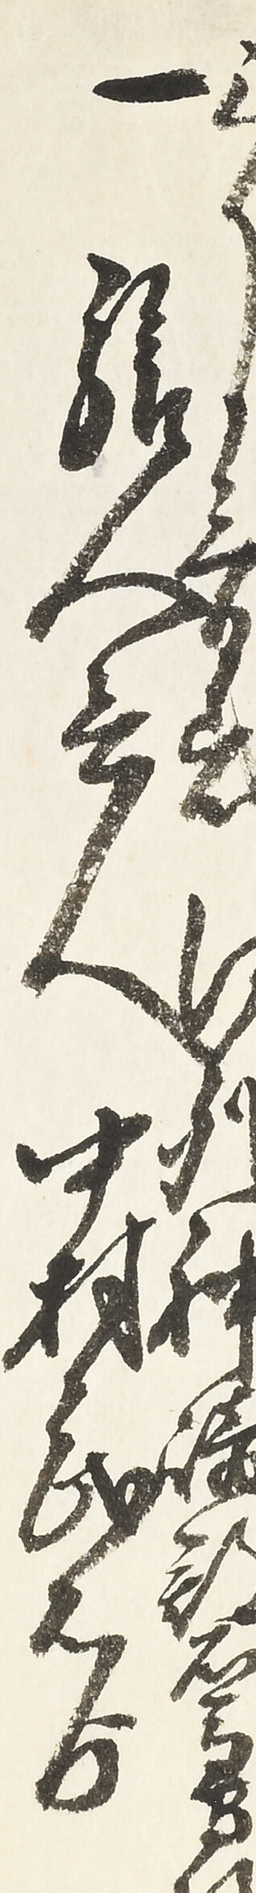一旅人壱人中村武右衛門
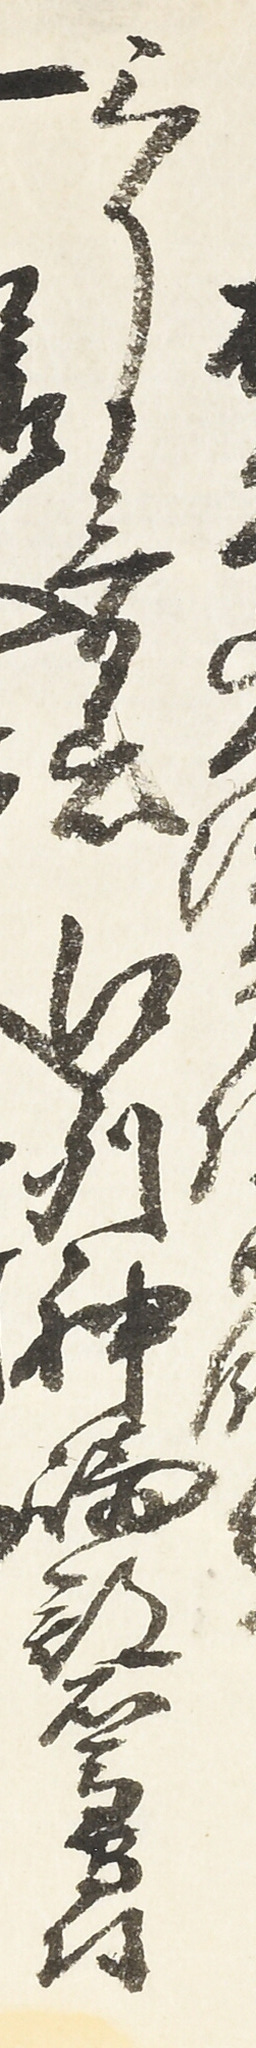三月三日着江州神崎郡石馬寺村
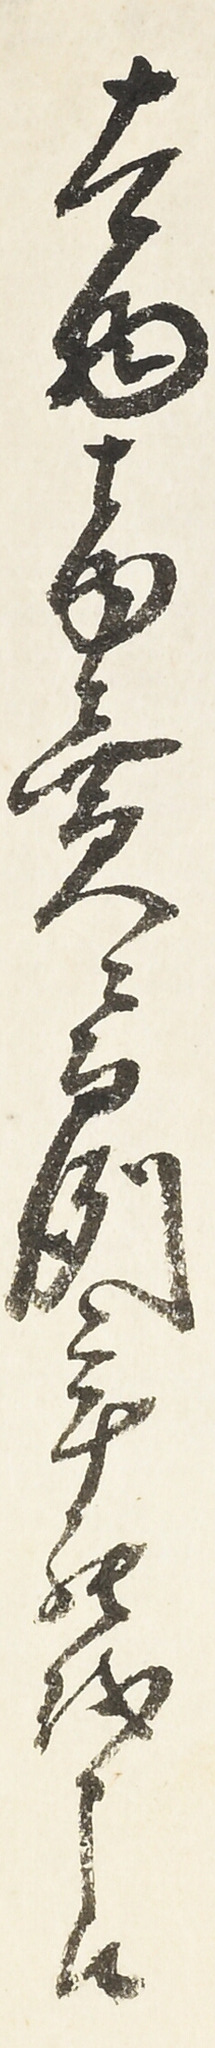太物商売ニ而例年罷越申候
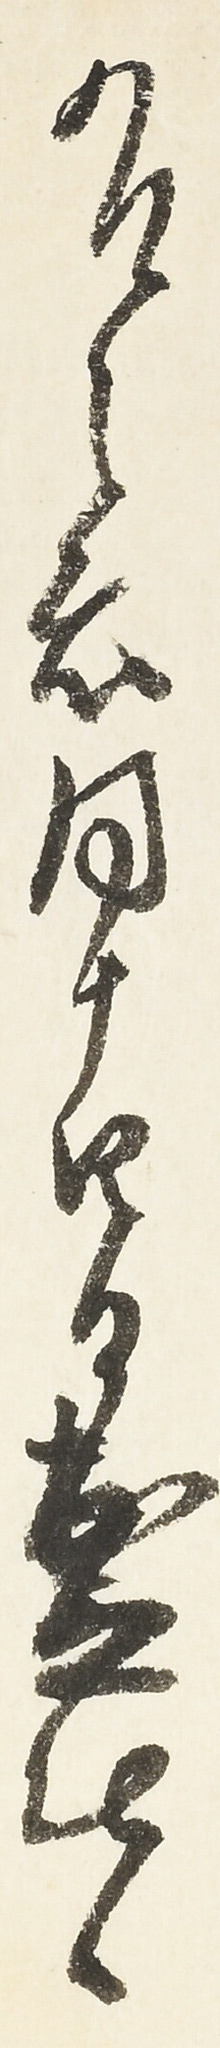右之者同十四日出立仕候
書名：町中旅人泊控帳
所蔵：伊那市立高遠町図書館・合同会社AMANE
